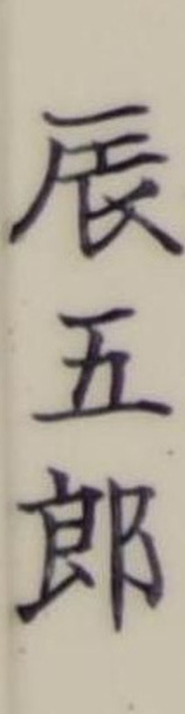辰五郎

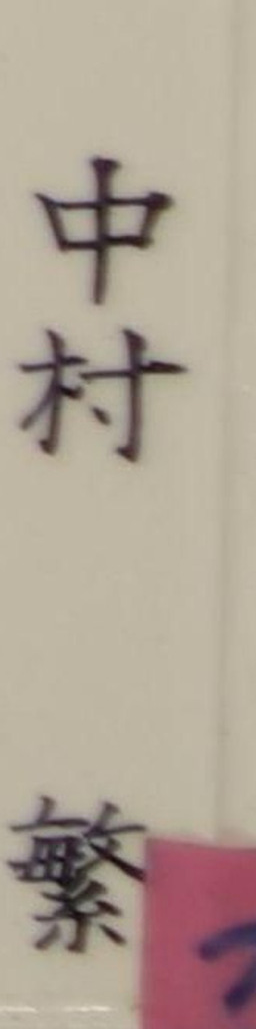中村繁
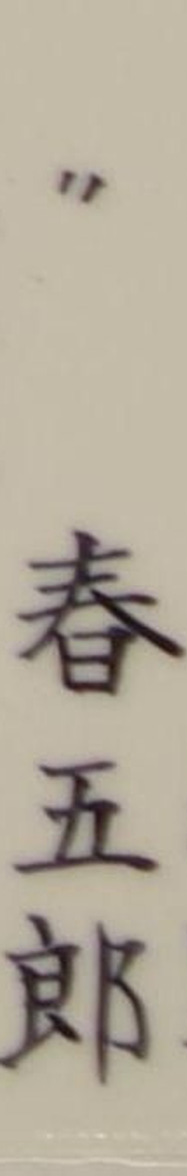春五郎
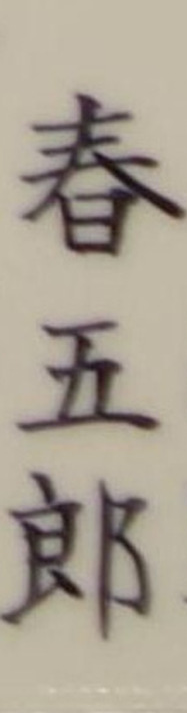春五郎
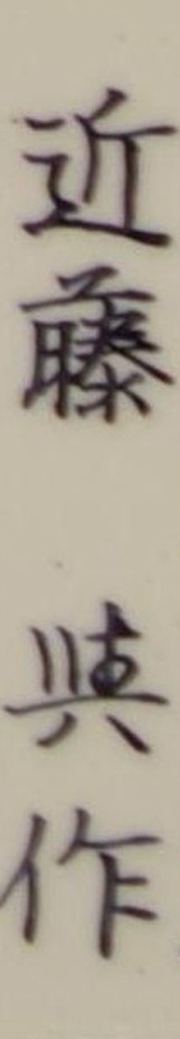近藤与作
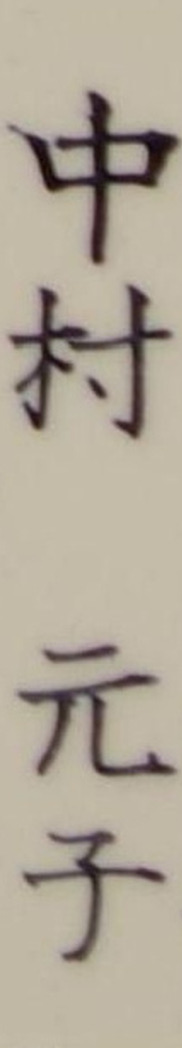中村元子
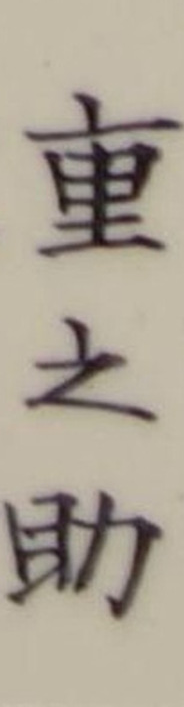重之助
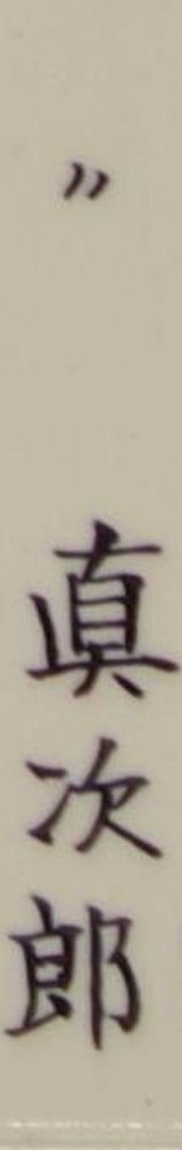真次郎
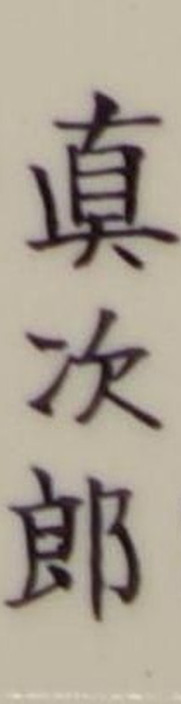真次郎
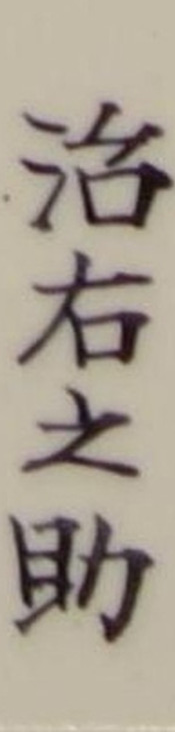治右之助
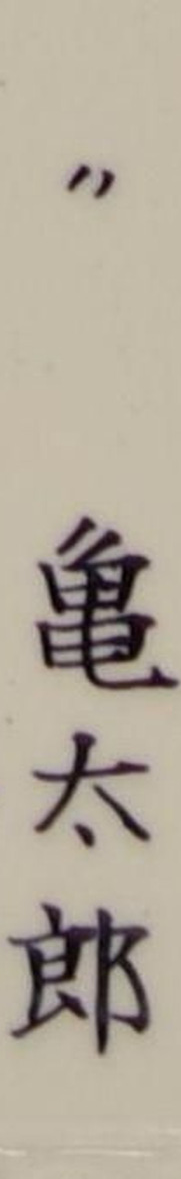亀太郎
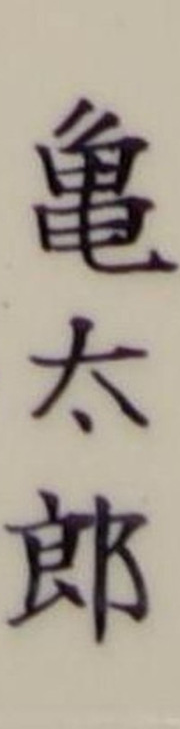亀太郎
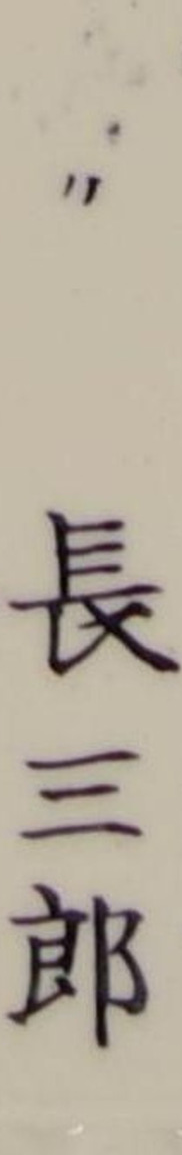長三郎
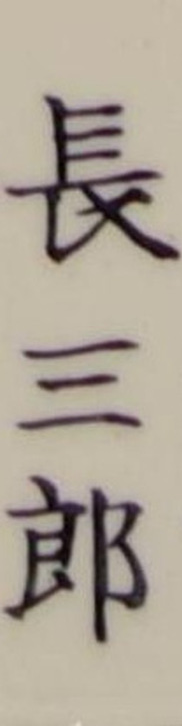長三郎
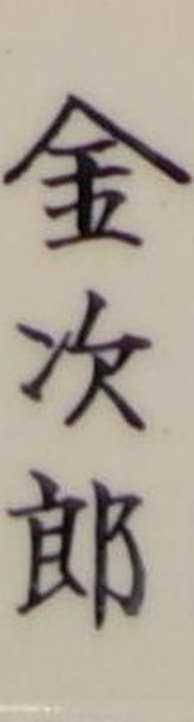金次郎
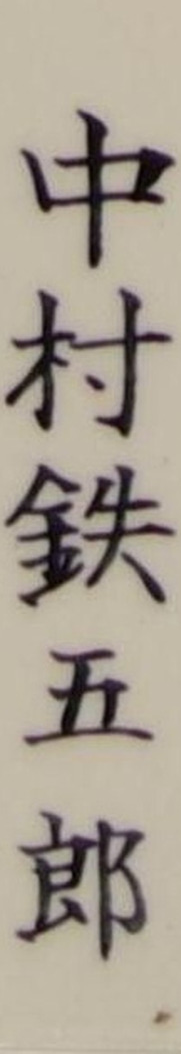中村鉄五郎
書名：E~L
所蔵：高野山金剛峯寺
